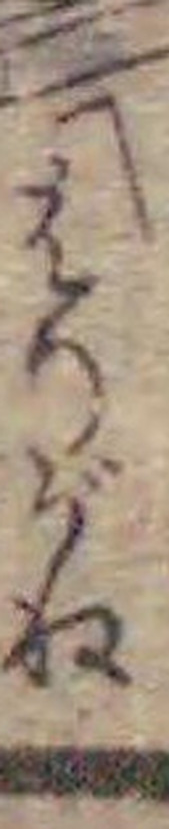〽はりがね
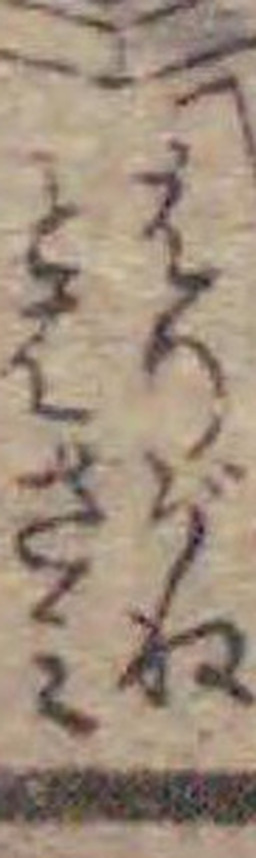とはきみ
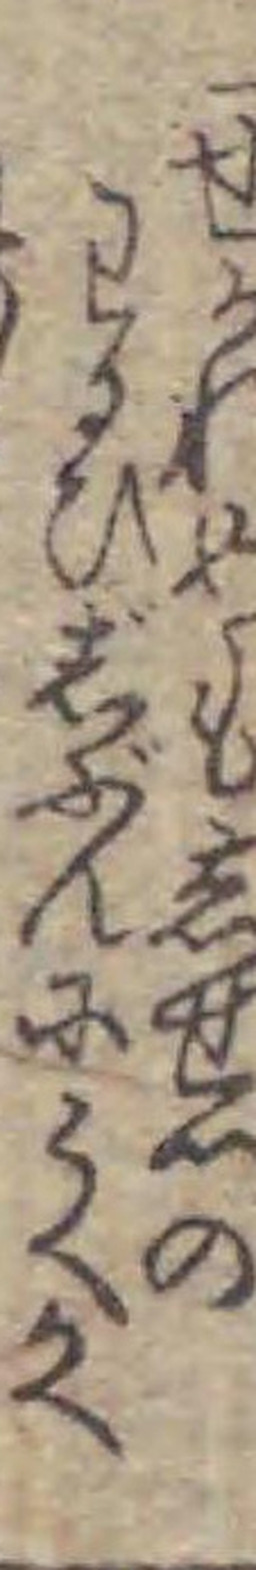わるひじぶんにうへかへ
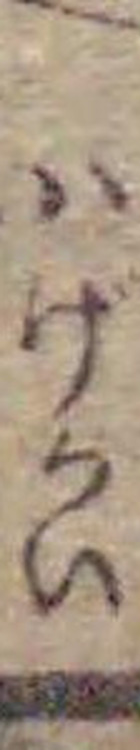はげかい
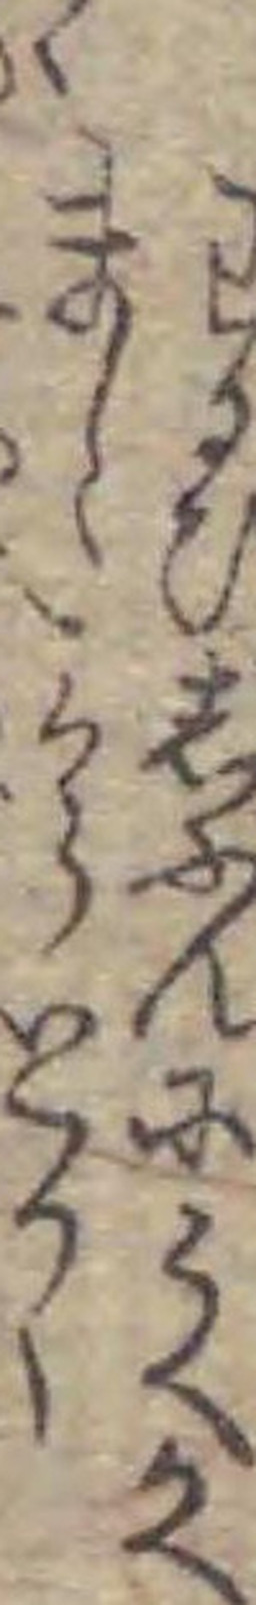ましたからとかく
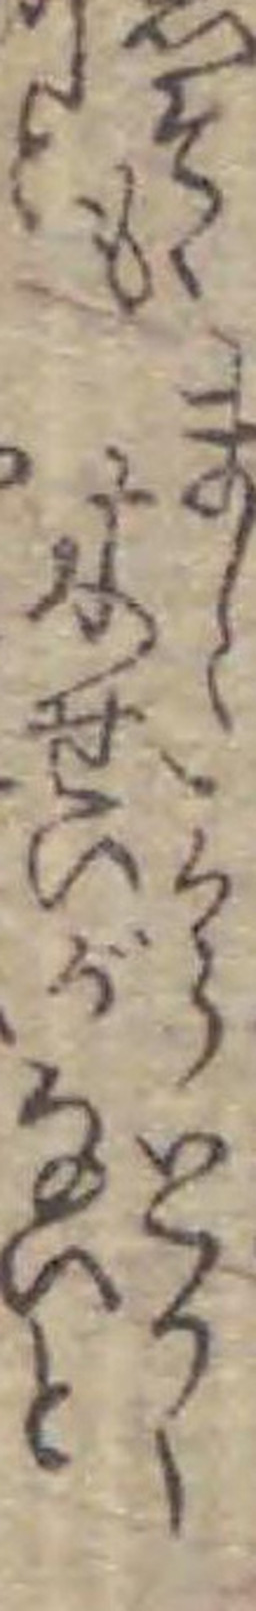木せいがないと
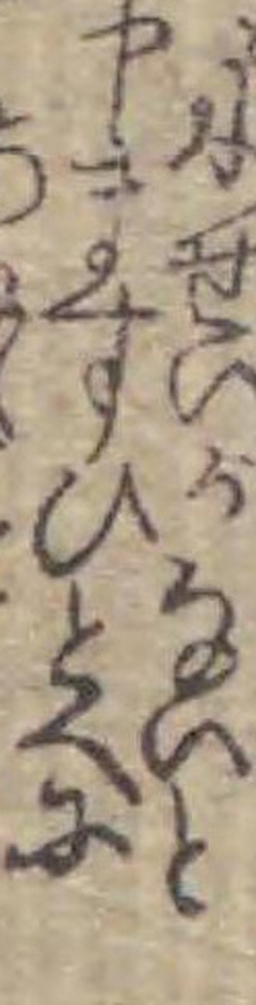申ますひとへに
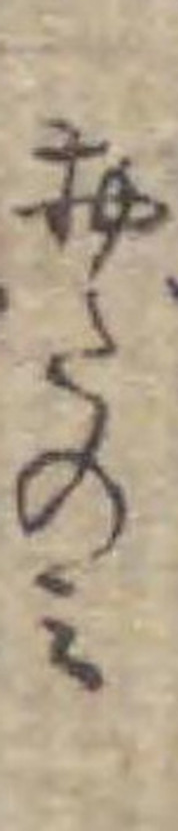おたのみ
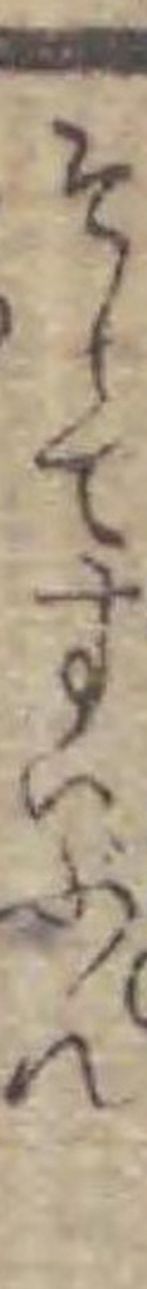そしてすいぶん
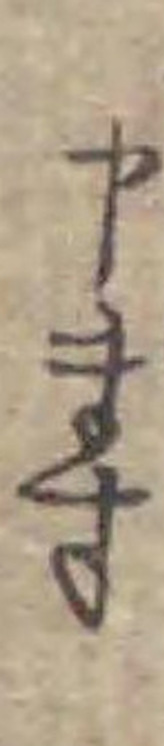申ます
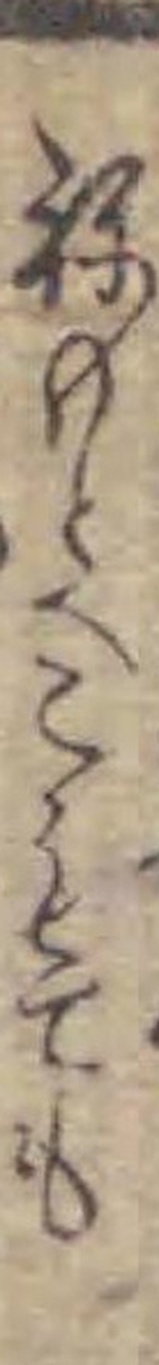ねもとへこもても
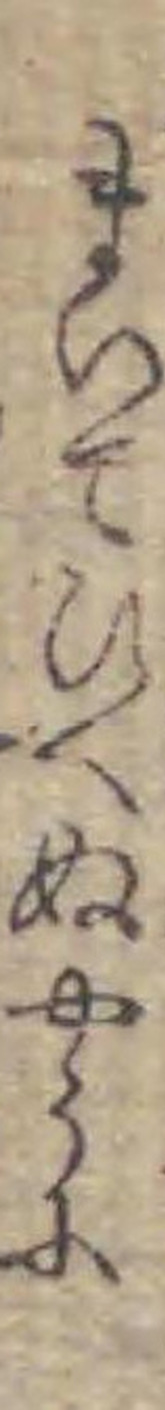まいてひへぬやうに
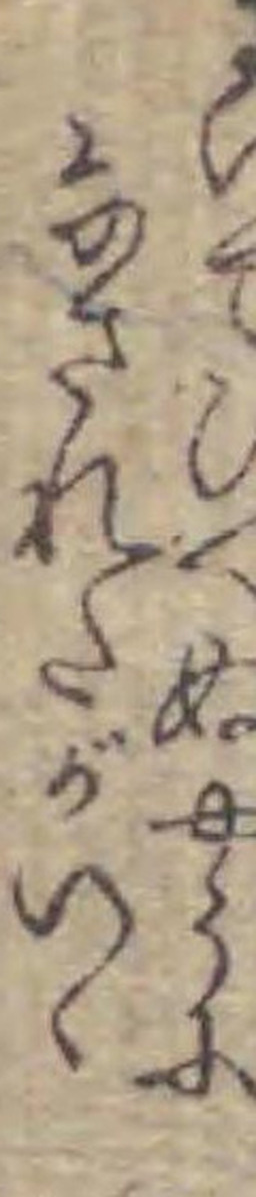なされたがいゝ
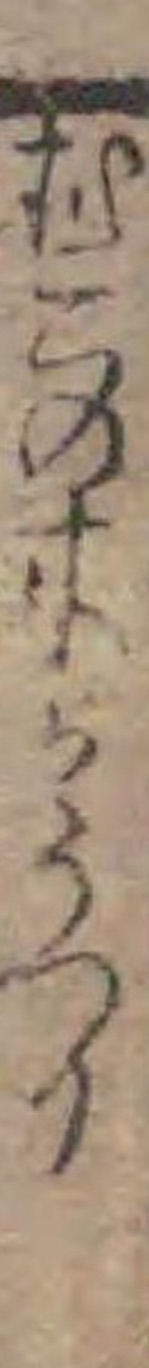むこの木がうつり
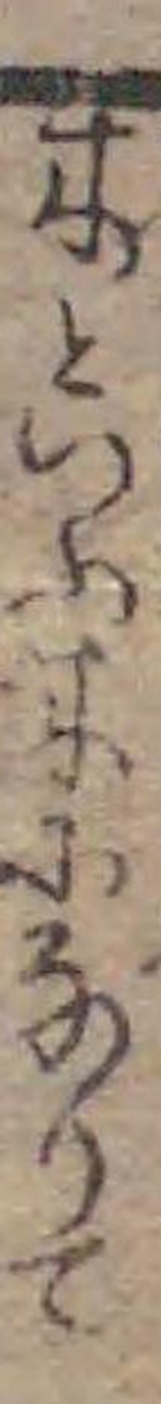木といふ木になりて
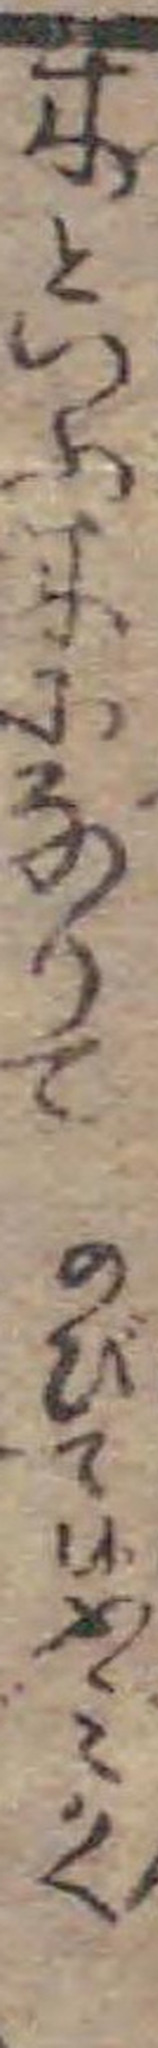木といふ木になりて
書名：奇妙頂礼胎錫杖 : 3巻
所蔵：国立国会図書館 National Diet Library, JAPAN
